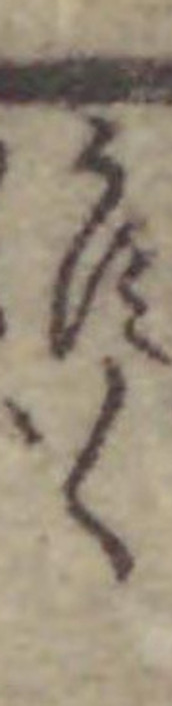うす〳〵
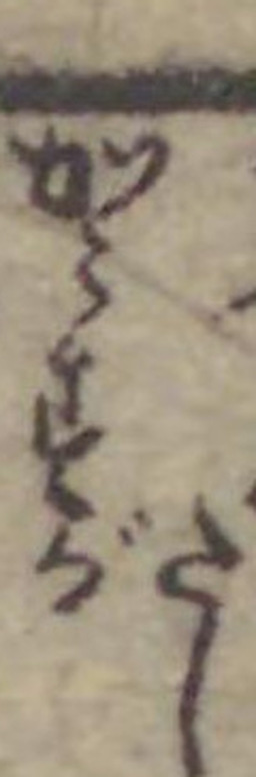からすが
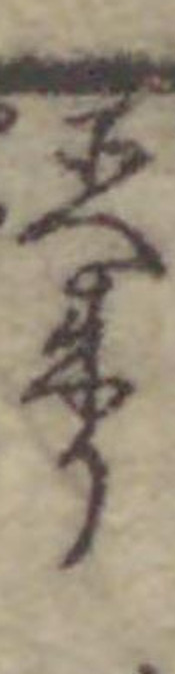所へ来り
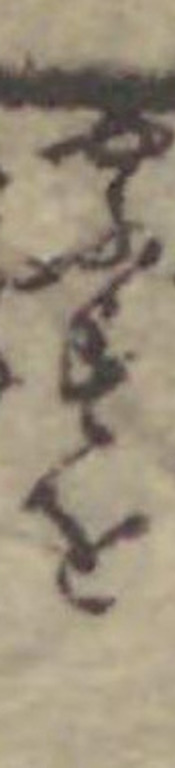やふすを
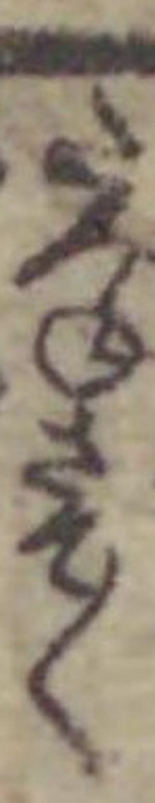たつねさて〳〵
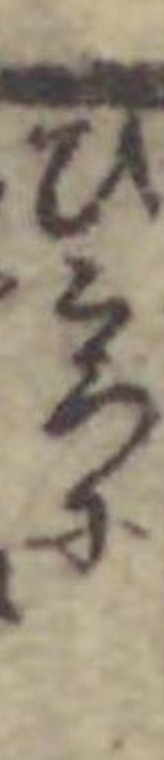ひころに
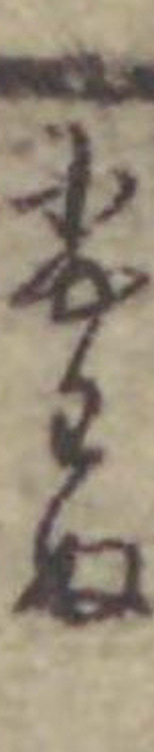にやわぬ
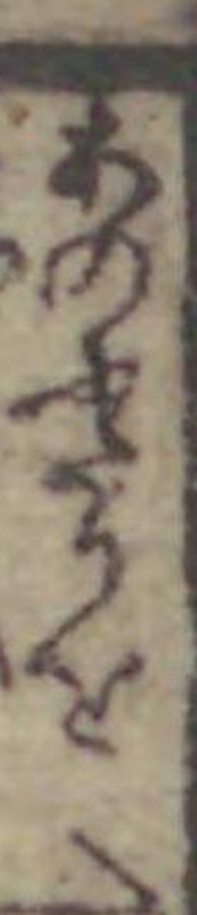あのふたりを
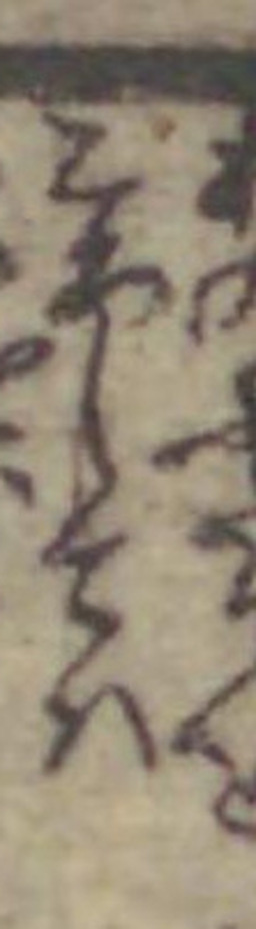ころしてハ
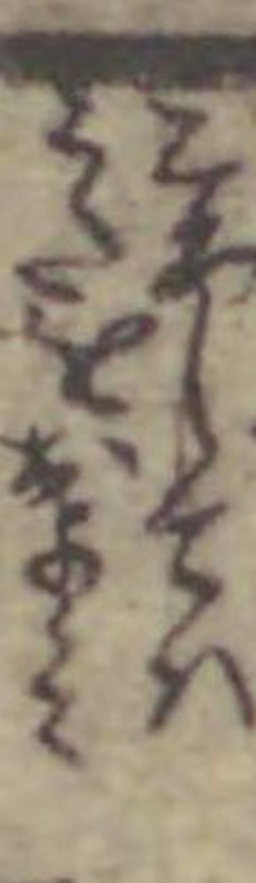うたをおよミ
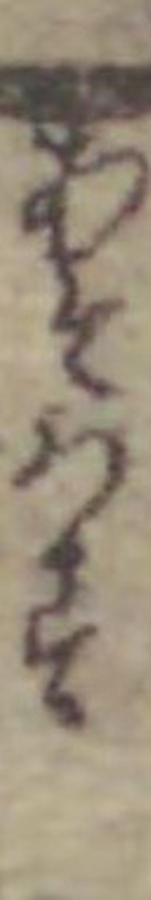あそハす
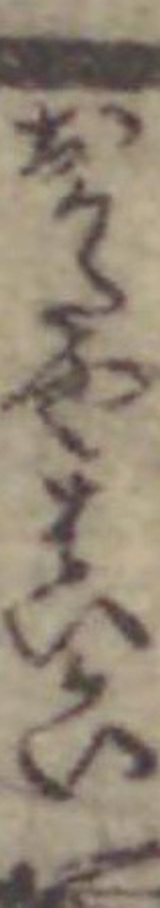おかたやはいかい
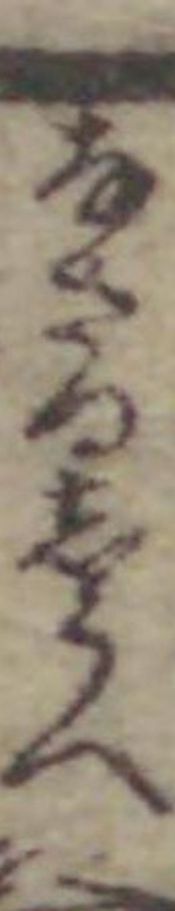なさるしうへ
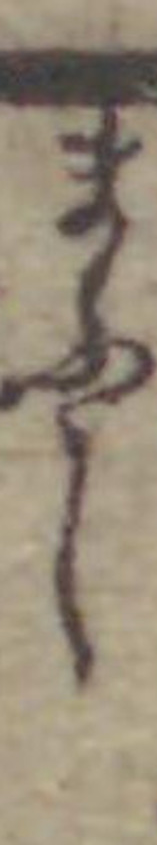まふし
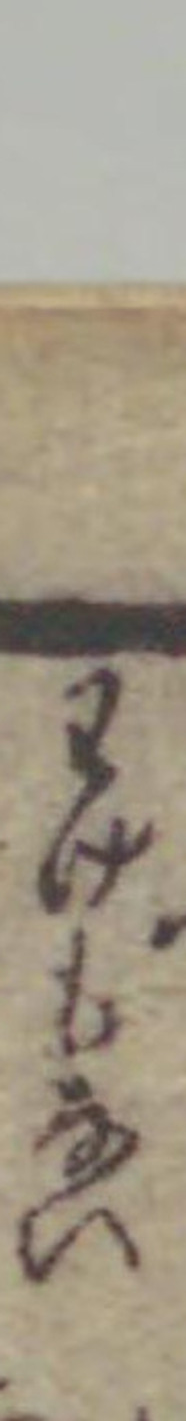わけもない
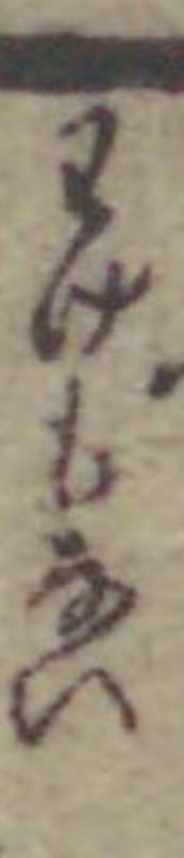わけもない
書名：烏行水諺草 3巻
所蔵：国立国会図書館 National Diet Library, JAPAN
